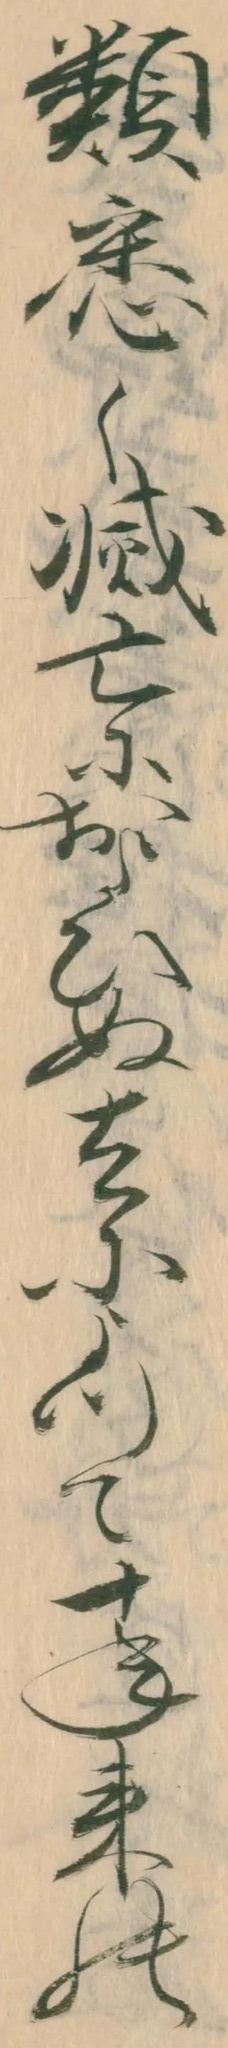類悉く滅亡におよひぬ去によつて十年来の
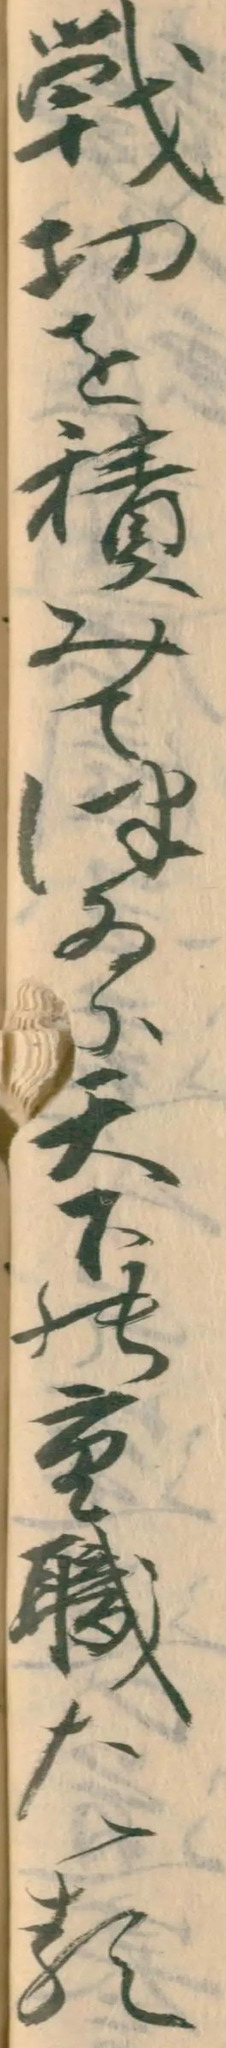戦功を積みてつゐに天下の重職たる
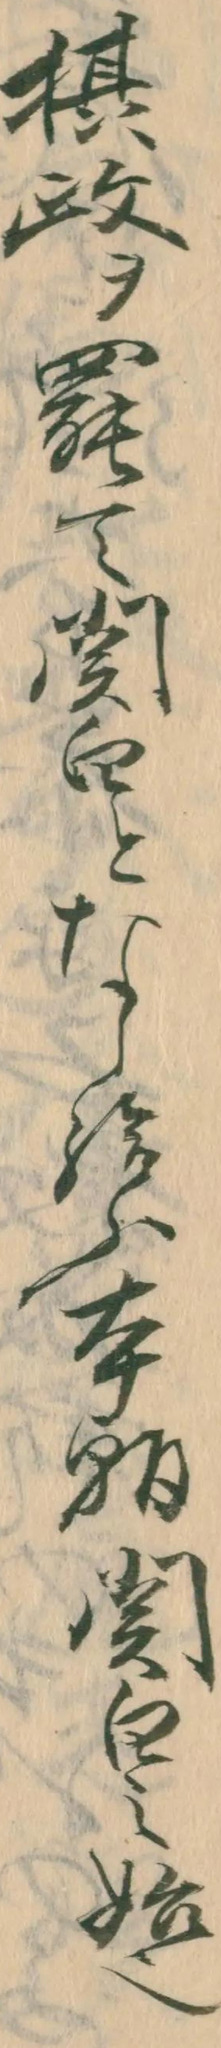摂政を罷て関白となし給ふ本朝関白之始也
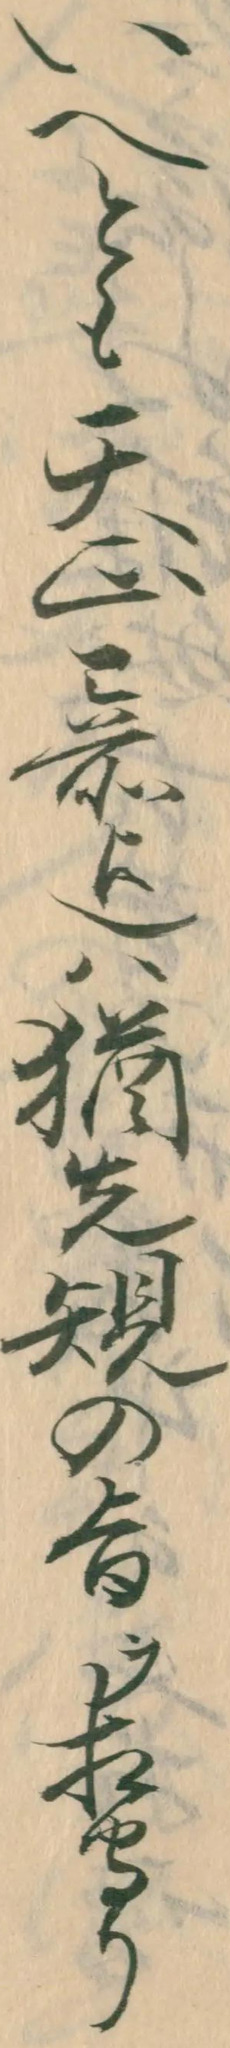いへとも天正已前迄は猶先規の旨を相守り
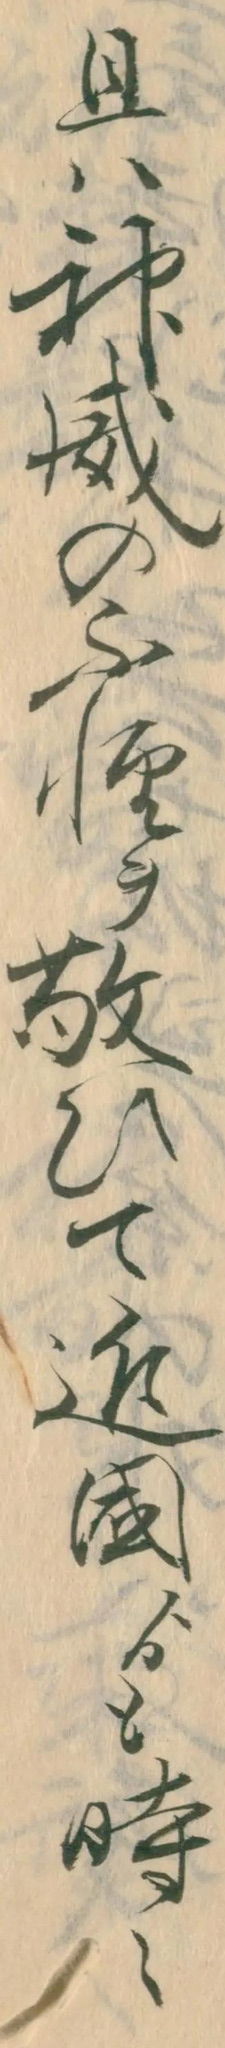且は神威の不軽を敬ひて近国ゟも時々
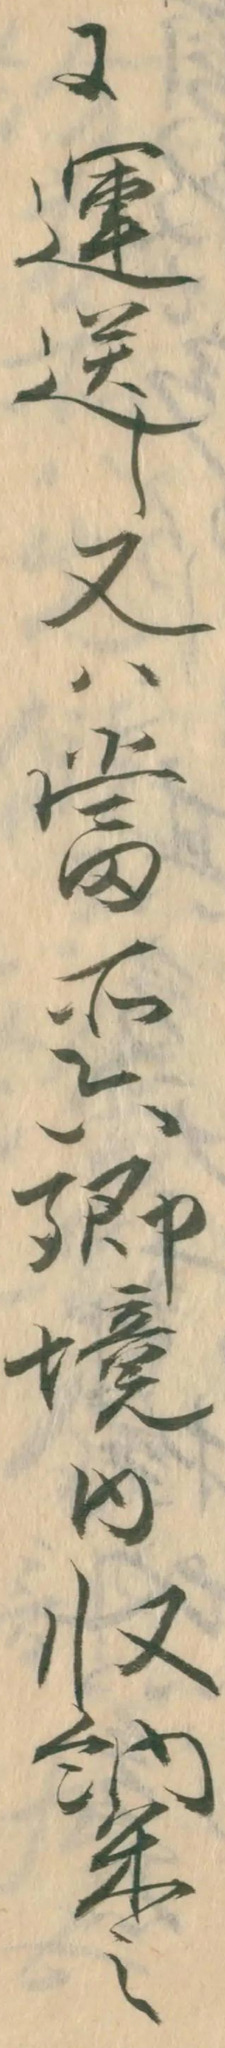に運送し又は当所六郷境内収納米之

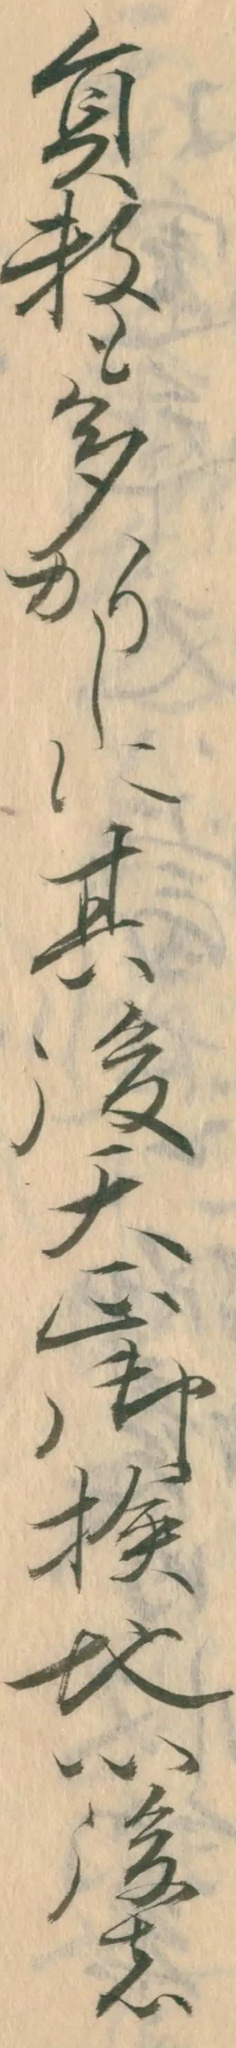員数も多かりしに其後天正御検地以後は
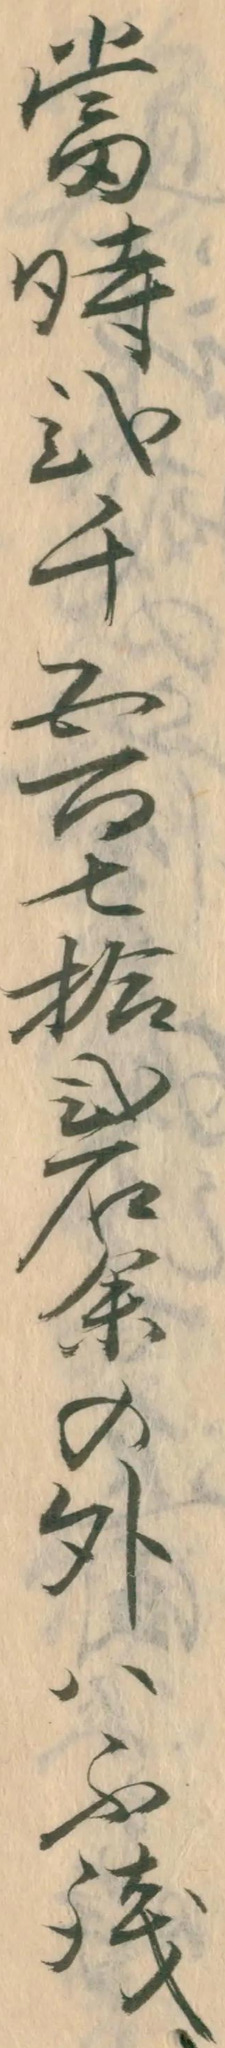当時弐千五百七十弐石余の外は不残
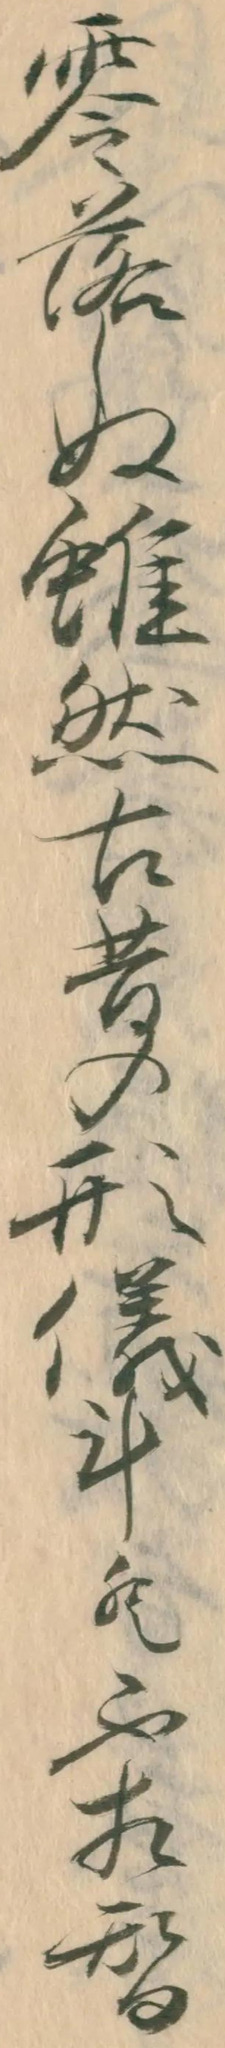零落しぬ雖然古昔の形儀計歟不相替
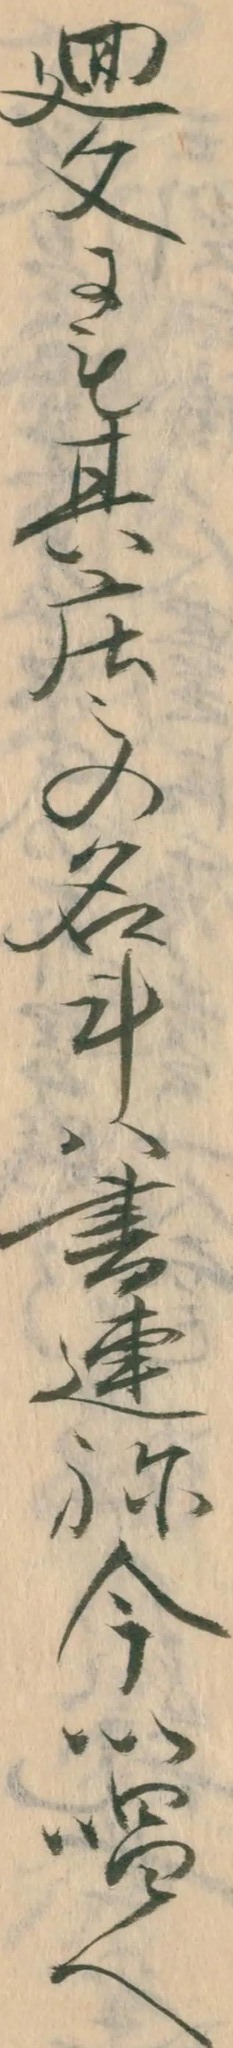廻文にも其庄々の名計は書連ね今以唱へ
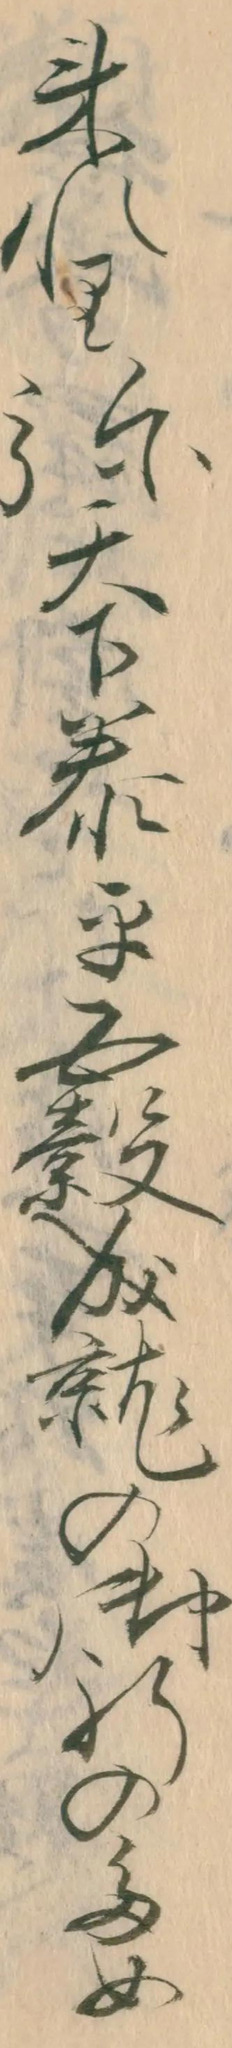来れり弥天下泰平五穀成就の御祈のため
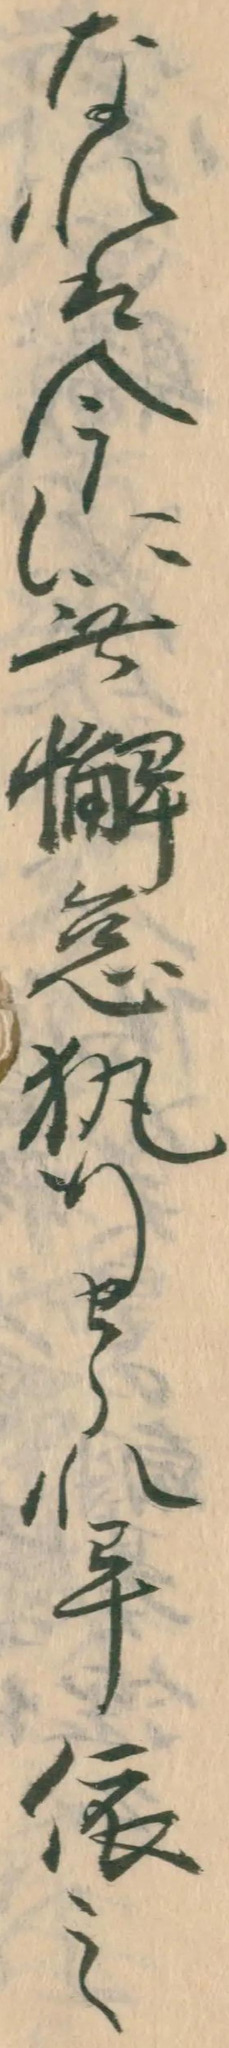なれは今に無懈怠執行せられ畢依之
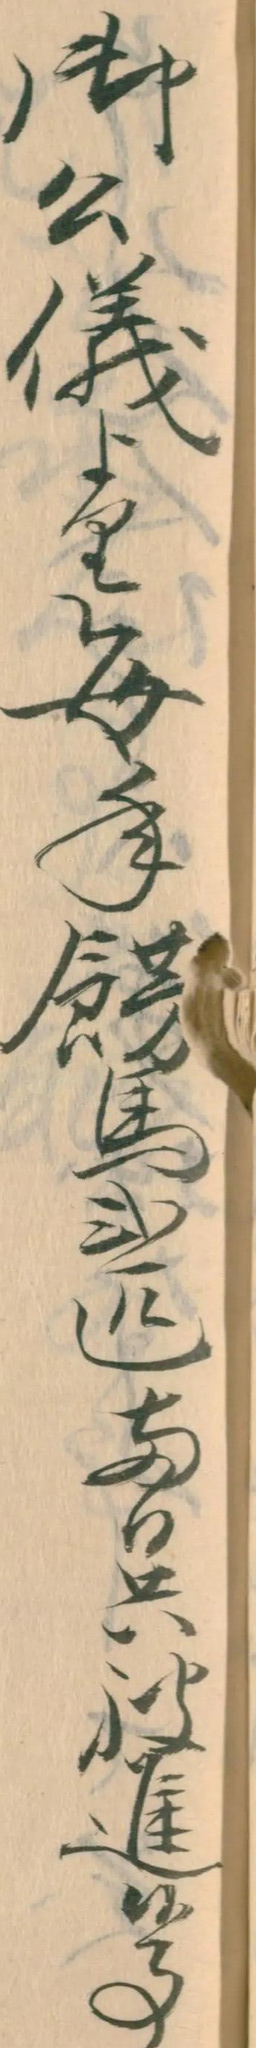御公儀より毎年飾馬弐匹両日共被進候事
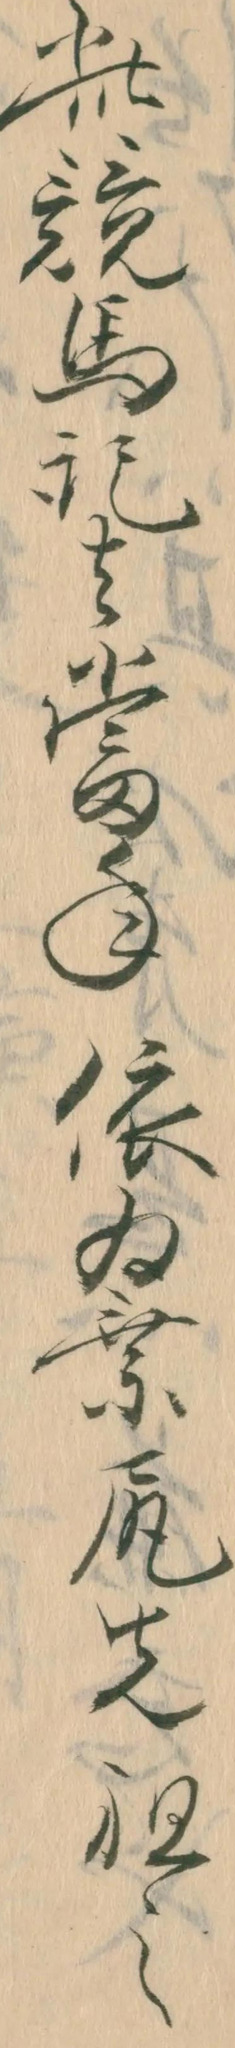此競馬記は当年依為乗尻先祖之
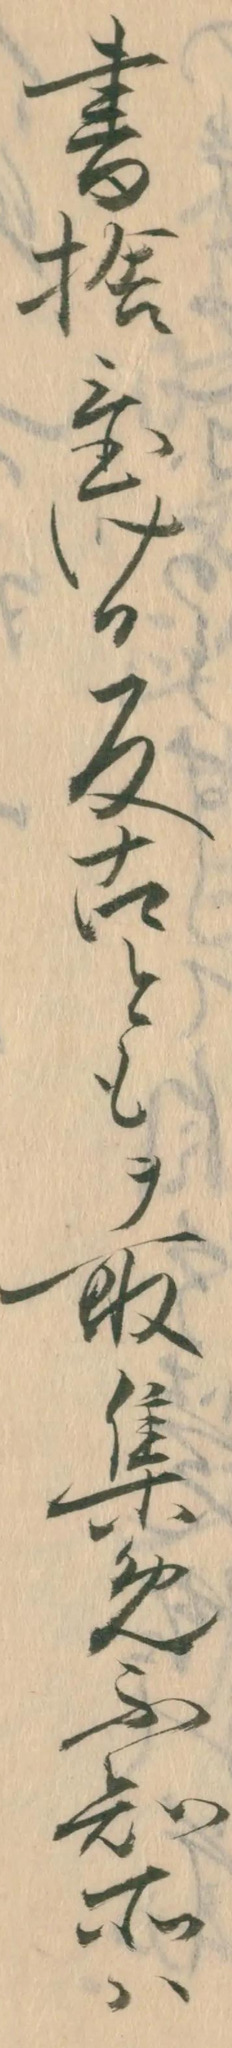書捨置ける反古ともを取集め不知所は
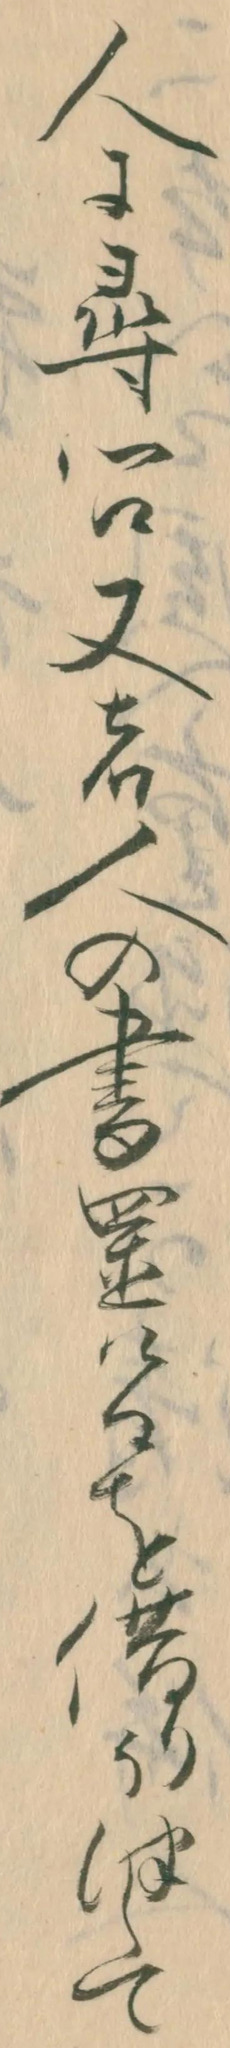人に尋問又は人の書置けるを借りうつして
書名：賀茂社記録. 第12冊
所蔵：国立国会図書館 National Diet Library, JAPAN
